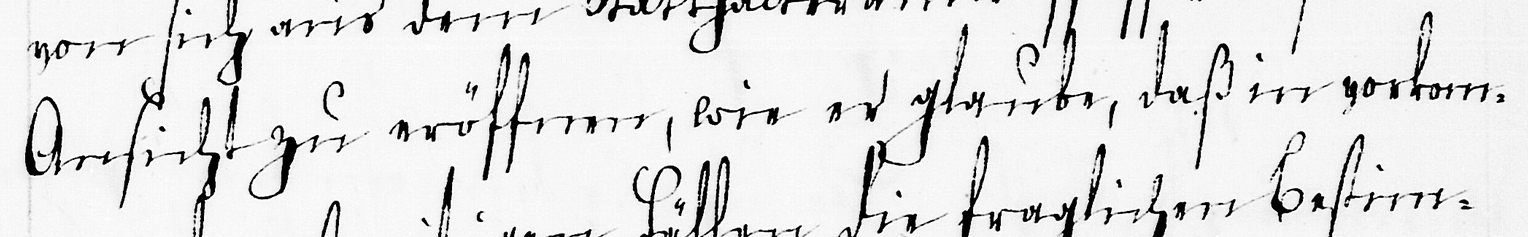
Ansicht zu eröffnen, wie er glaube, daß in vorkom¬
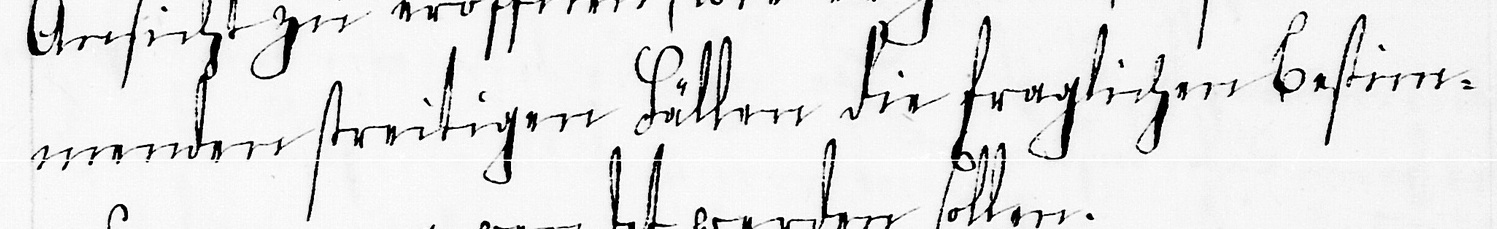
menden streitigen Fällen die fraglichen Bestimm¬
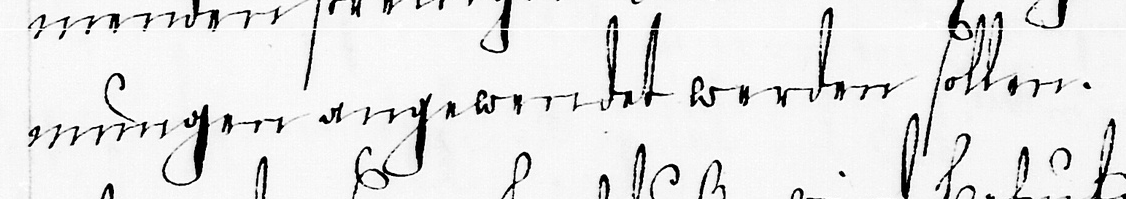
ungen angewendet werden sollen.
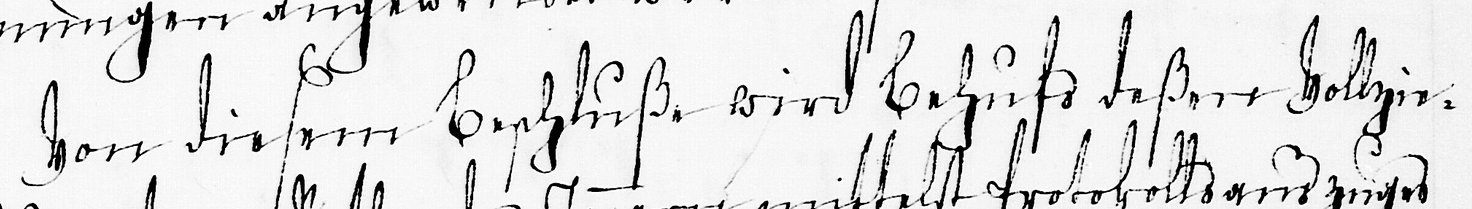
Von diesem Beschluße wird Behufs deßen Vollzi¬
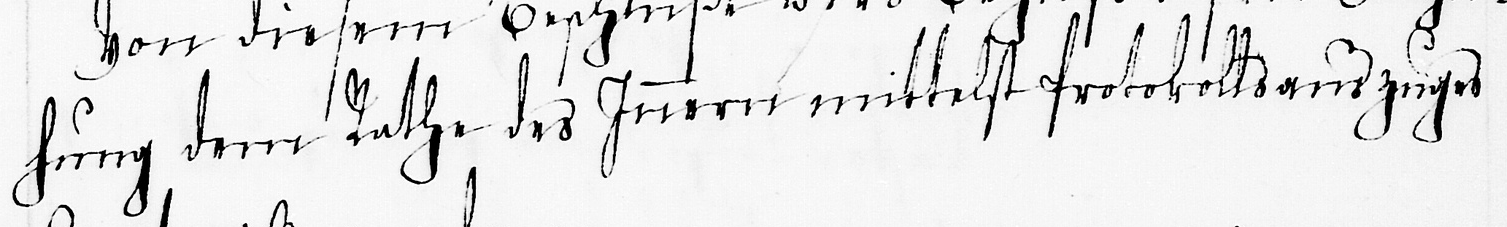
ehung dem Rathe des Innern mittelst Protokollsauszuges
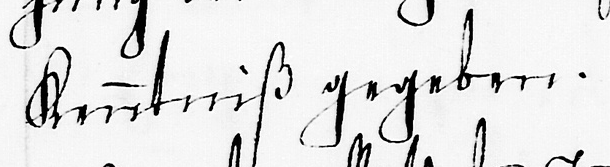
Kenntniß gegeben.
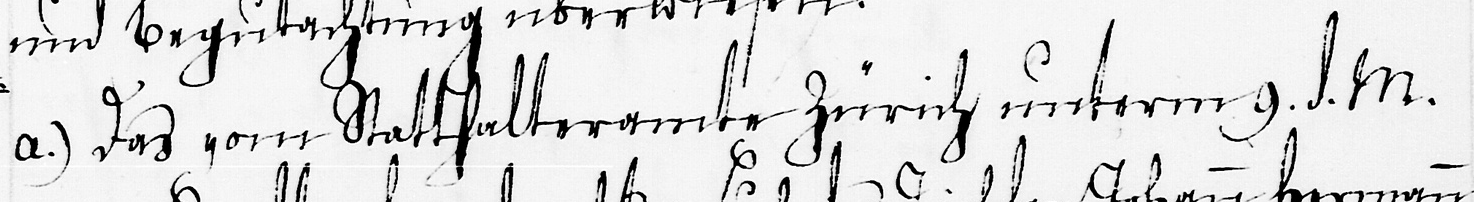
a.) Das vom Statthalteramte Zürich unterm 9. d. M.
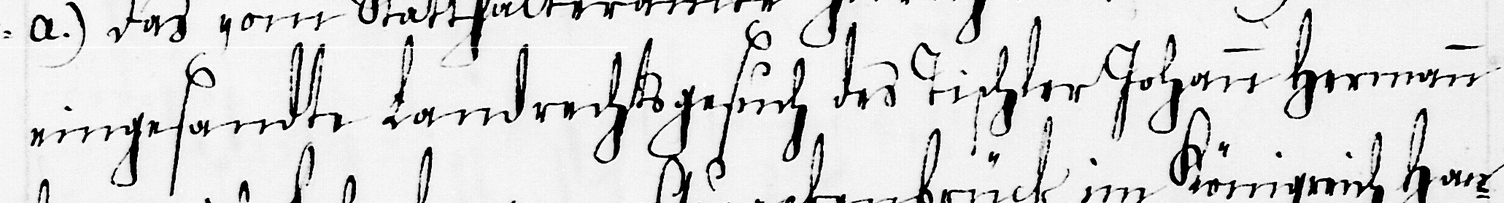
eingesandte Landrechtsgesuch des Tischler Johann Hermann
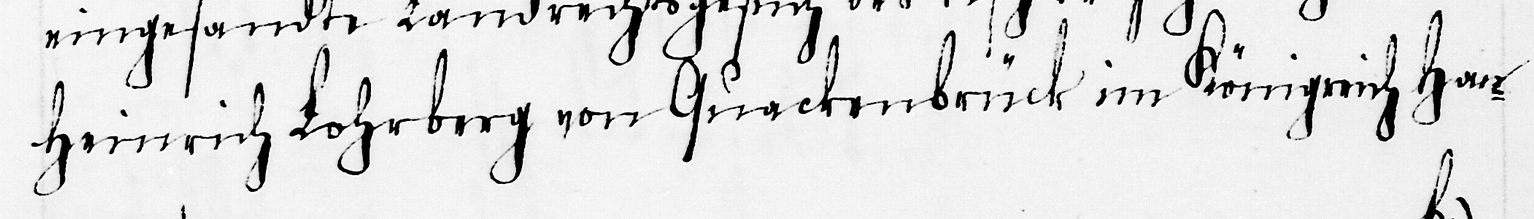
Heinrich Lohrberg von Quackenbrück im Königreich Han¬
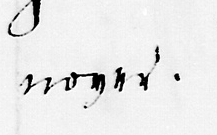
nover.
